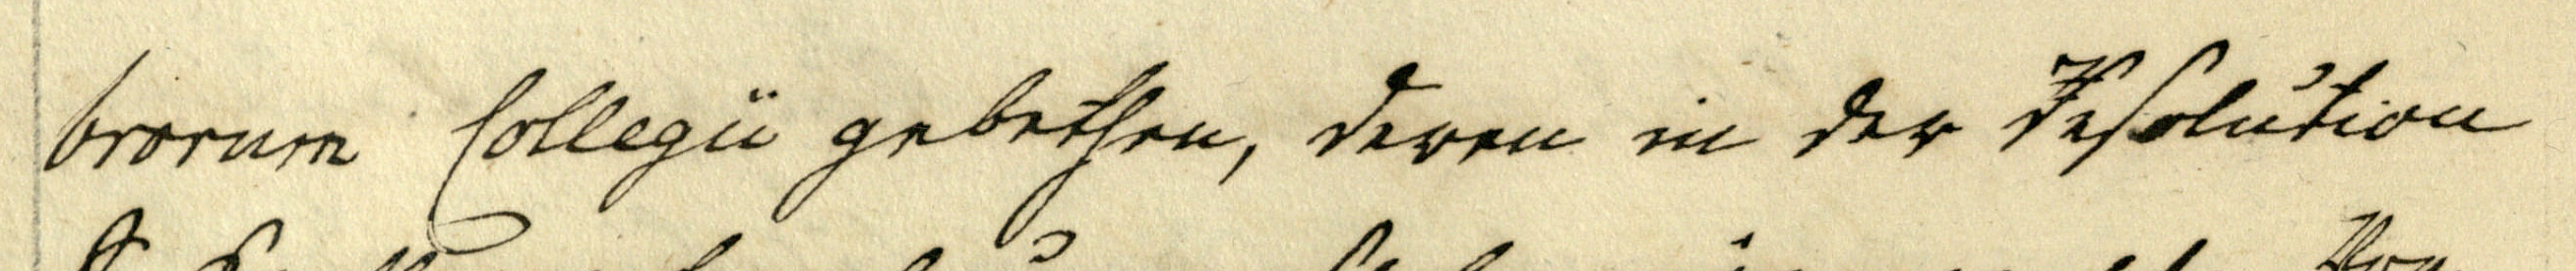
brorum Collegii gebethen, deren in der Resolution
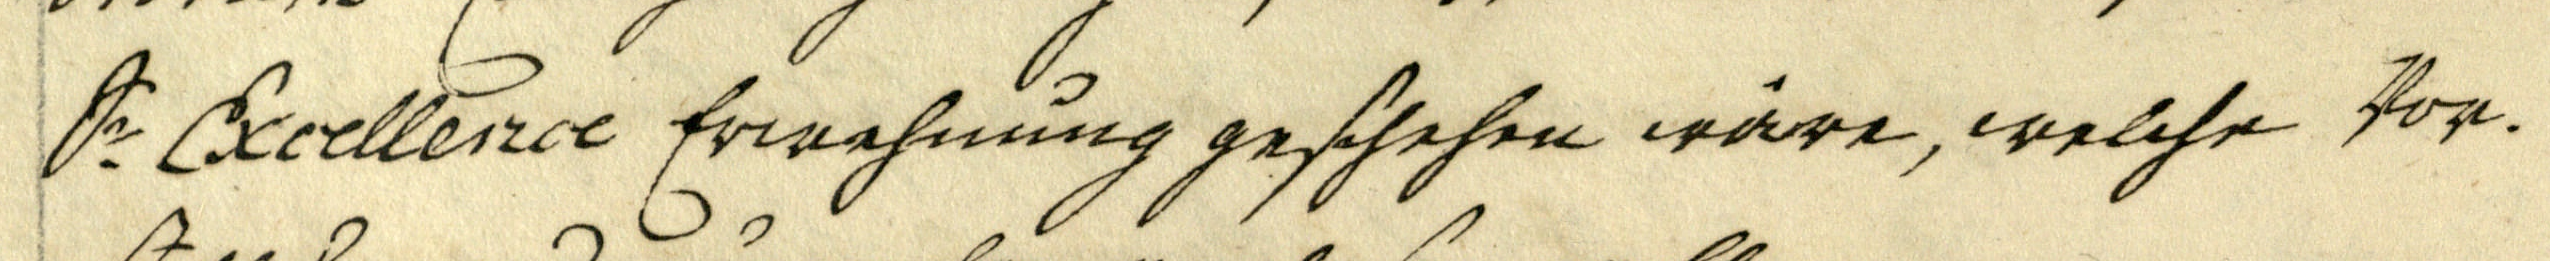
Sr Excellence Erwehnung geschehen wäre, welche V¬or
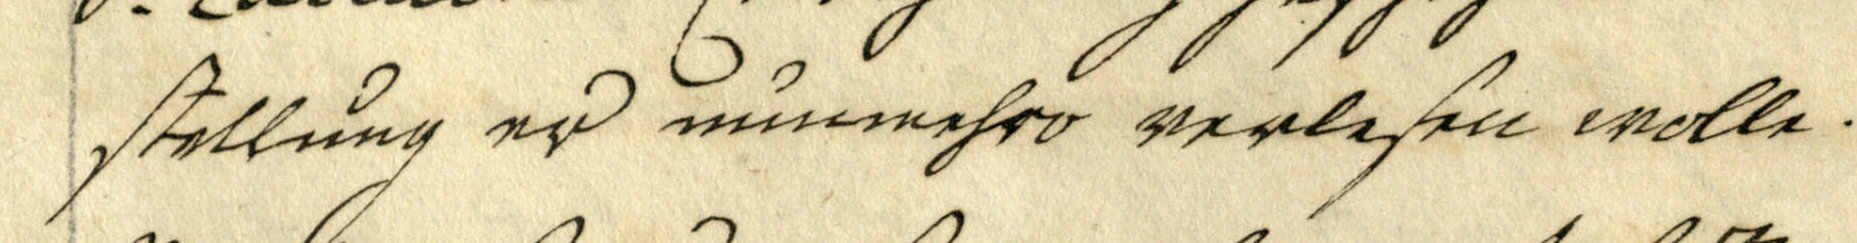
stellung er nunmehro verlesen wolle.
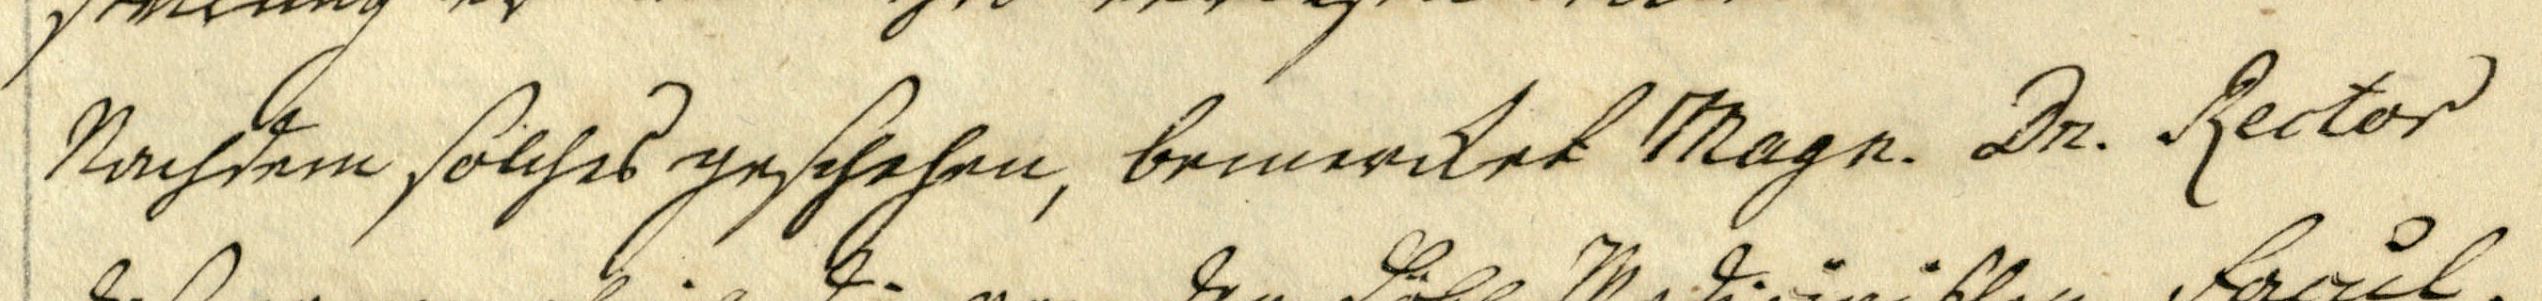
Nachdem solches geschehen, bemercket Magn. Dn. Rector
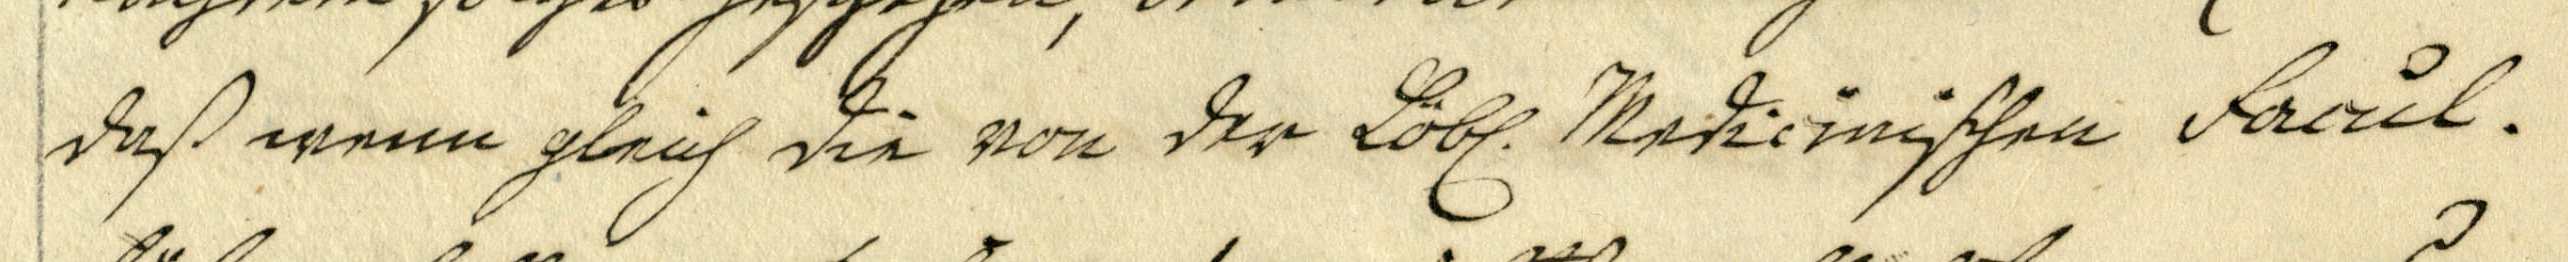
daß wenn gleich die von der Löbl. Medicinischen Facul¬
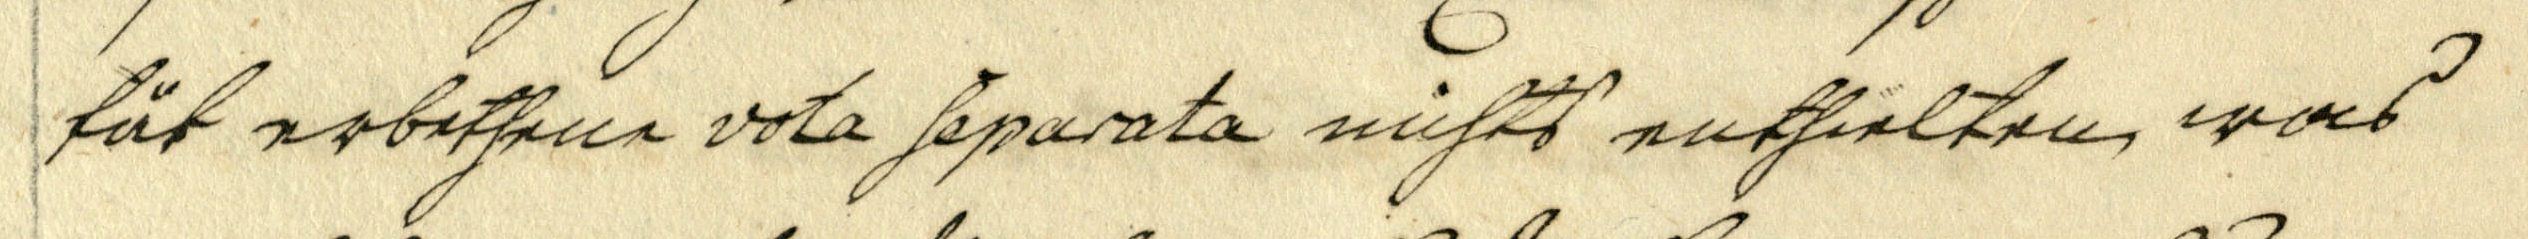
tät erbethene vota separata nichts enthielten, was
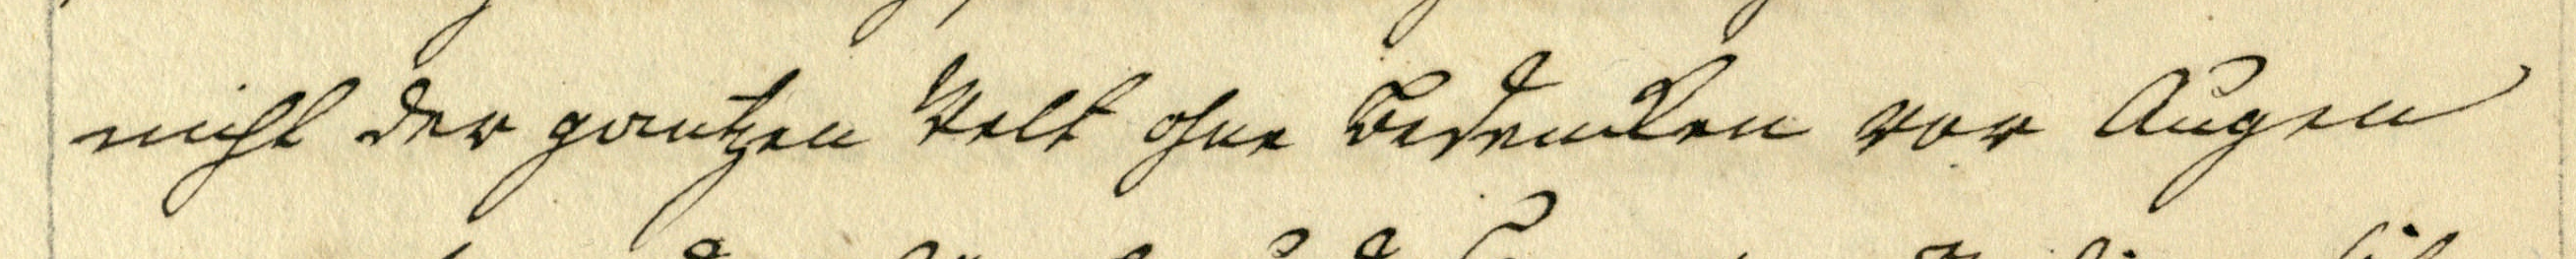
nicht der gantzen Welt ohne Bedencken vor Augen
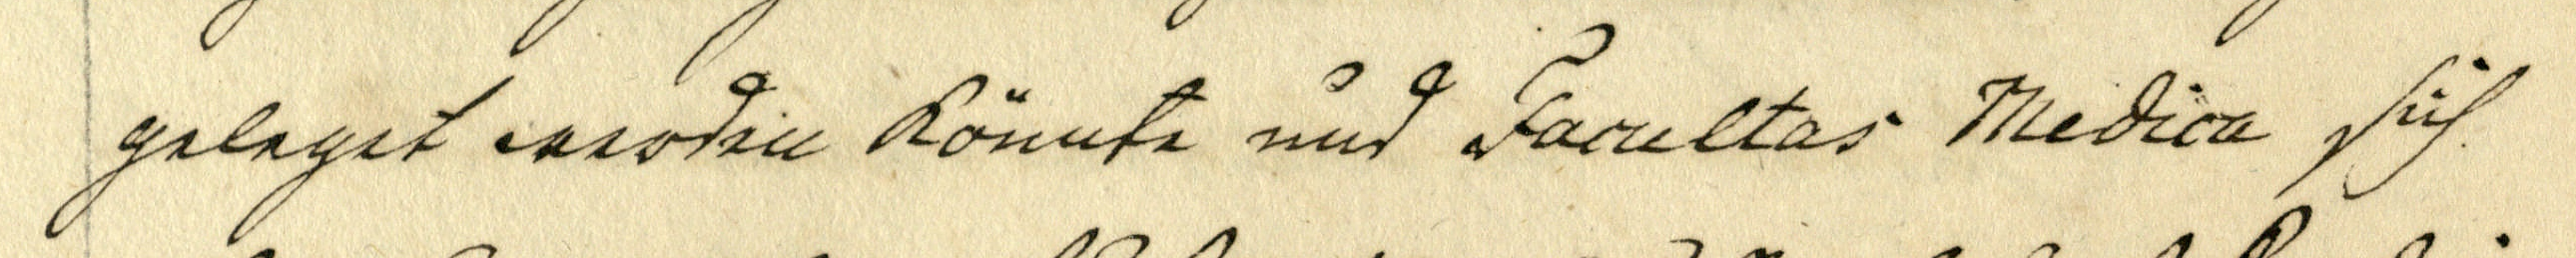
gelegt werden könnte und Faultas Medica sich
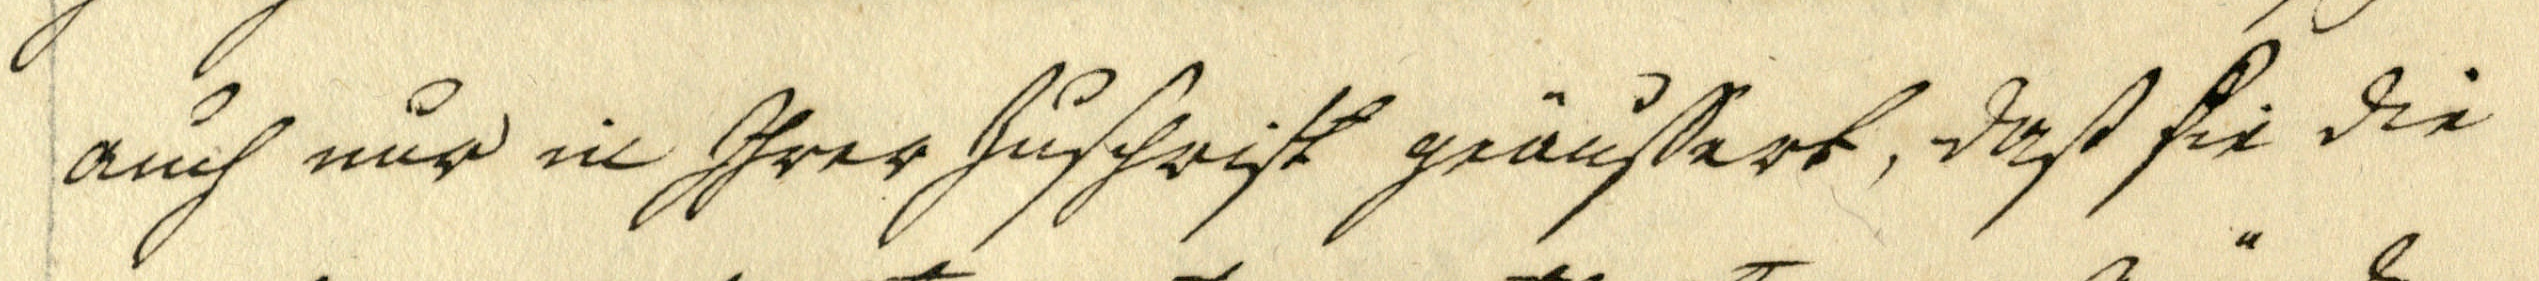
auch nur in ihrer Zuschrift geäussert, daß sie die
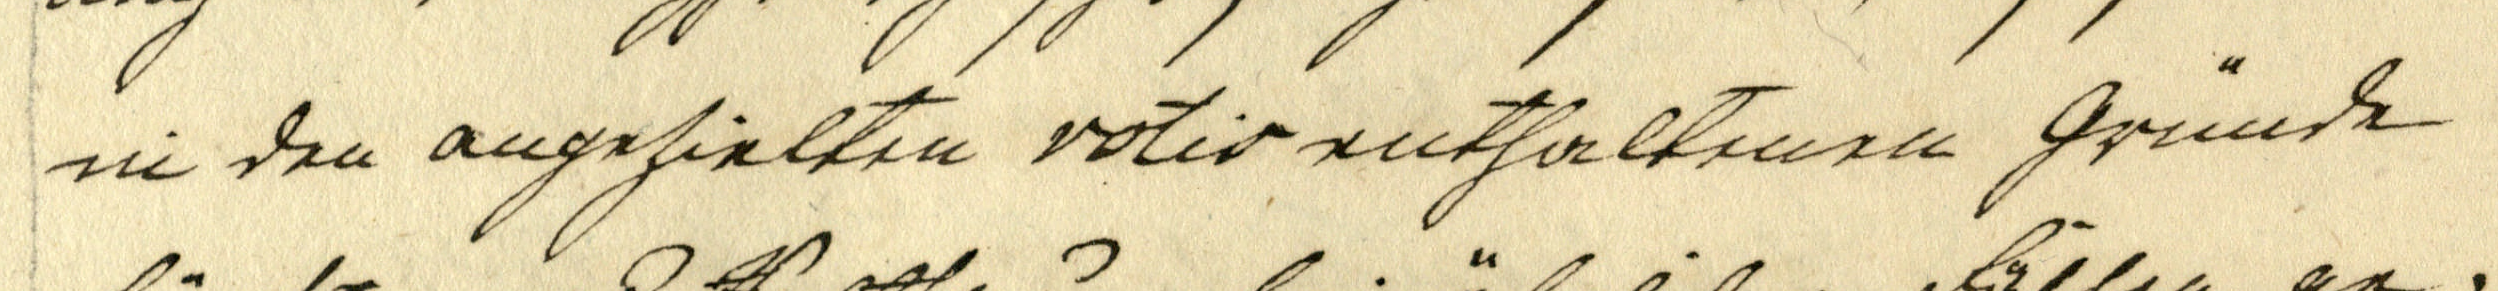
in den angezielten votis enthaltenen Gründe
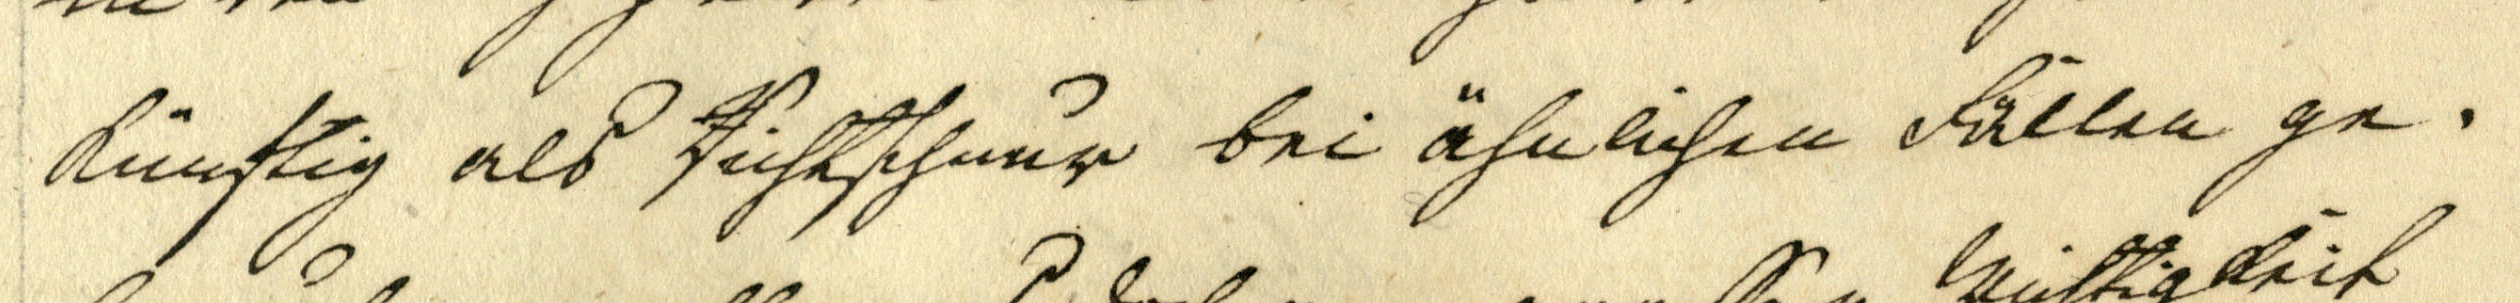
künftig als Richtschnur bei ähnlichen Fällen ge¬
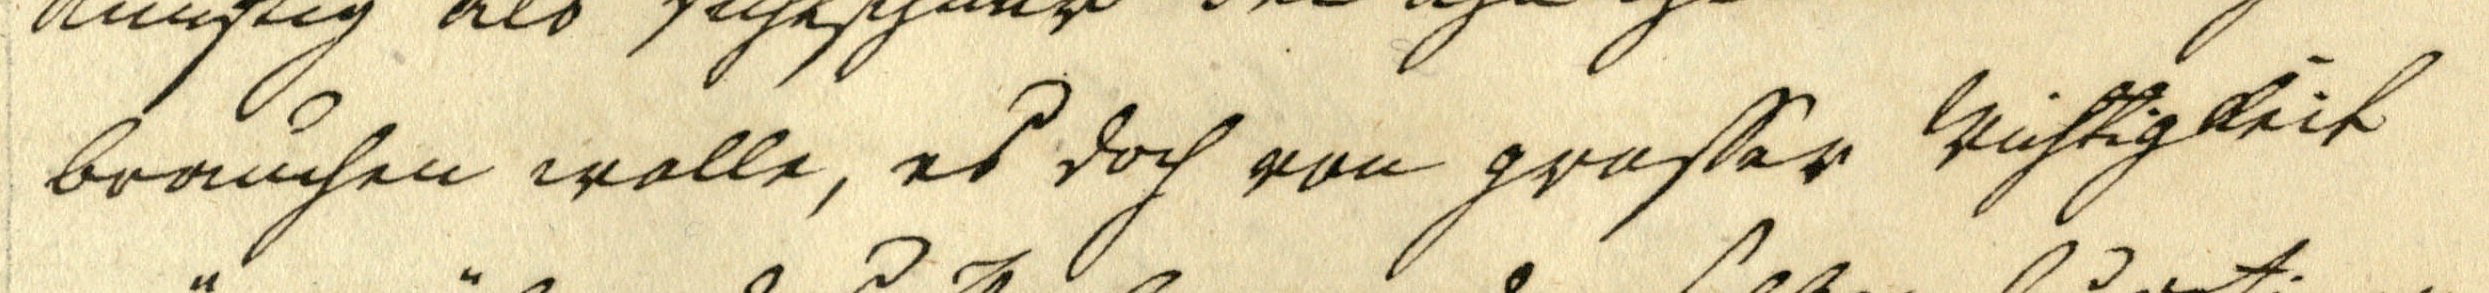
brauchen wolle, es doch von grosser Wichtigkeit
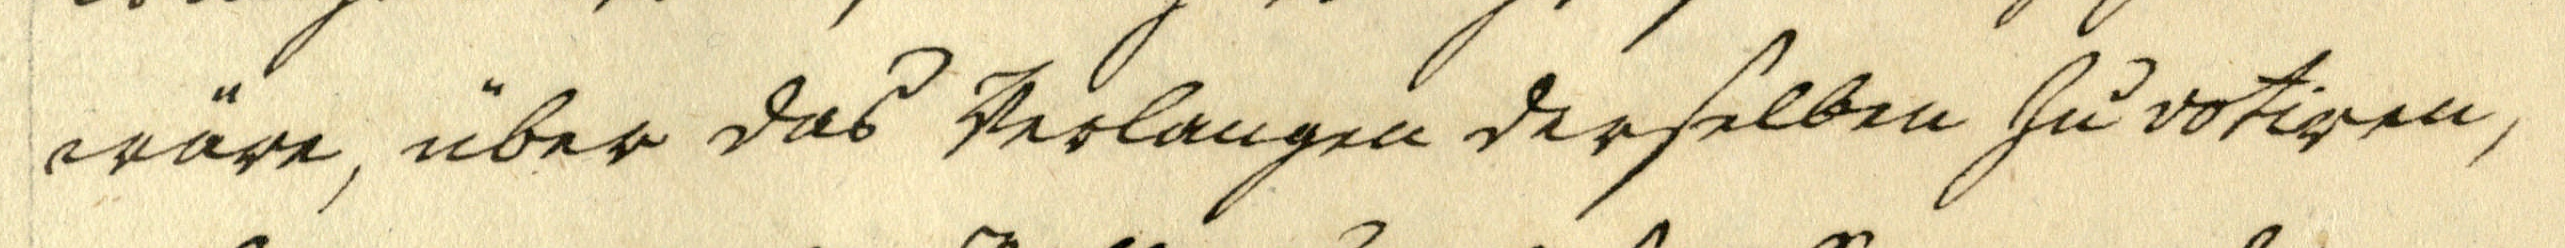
wäre, über das Verlangen derselben zu votiren,
